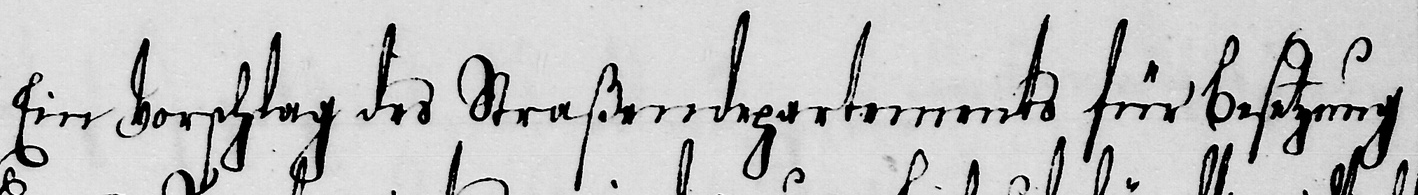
Ein Vorschlag des Straßendepartements für Besetzung
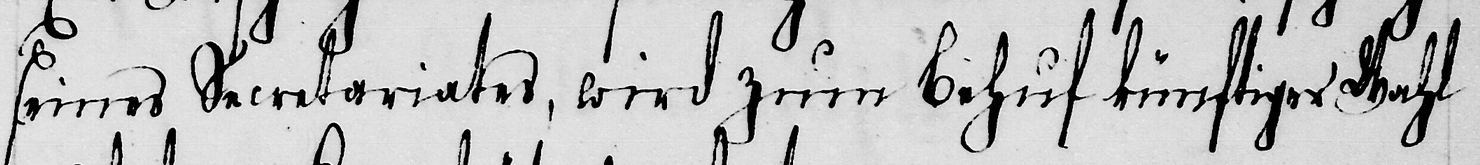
seines Secretariates, wird zum Behuf künftiger Wahl
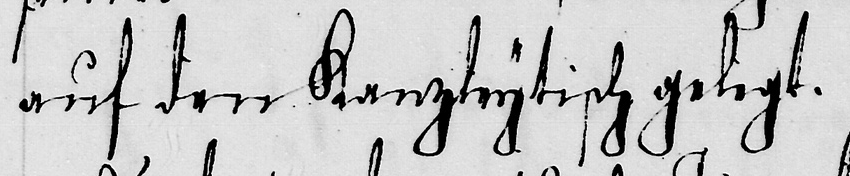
auf den Kanzleytisch gelegt.
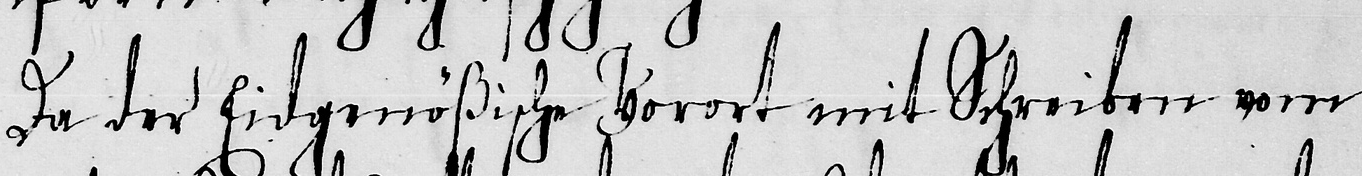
Da der Eidgenößische Vorort mit Schreiben vom
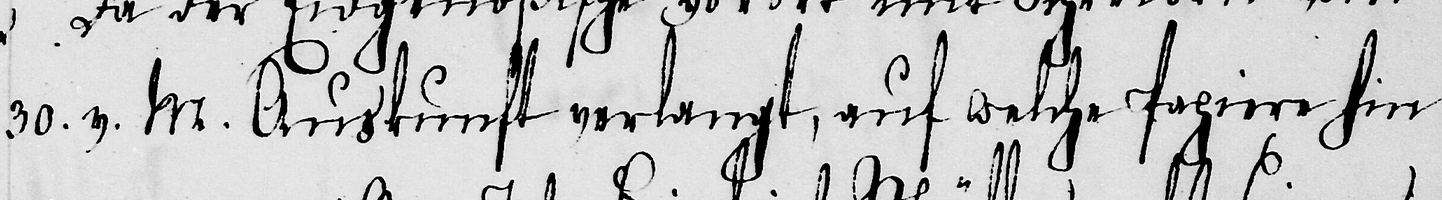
30. v. M. Auskunft verlangt, auf welche Papiere hin
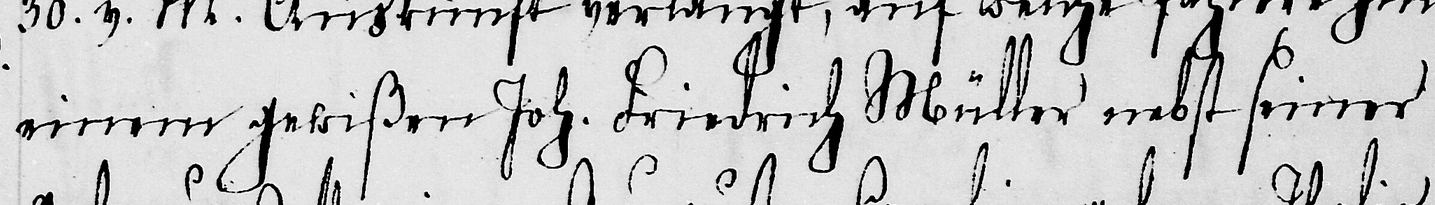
einem gewißen Joh. Friedrich Müller nebst seiner
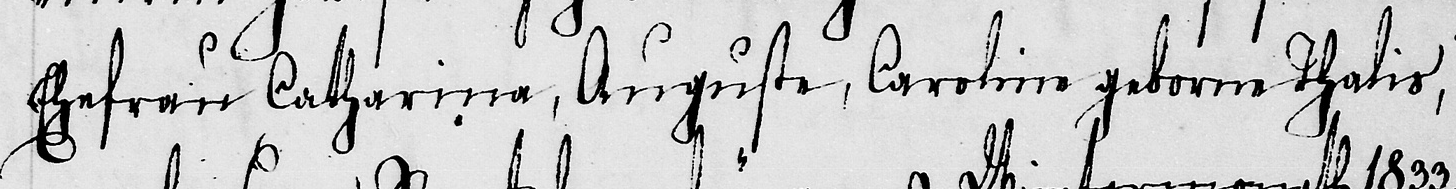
Ehefrau Catharina, Auguste, Caroline geborne Thalis,
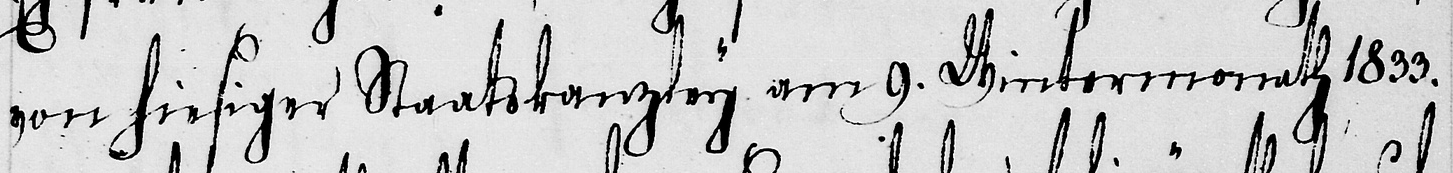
von hiesiger Staatskanzley am 9. Wintermonath 1833.
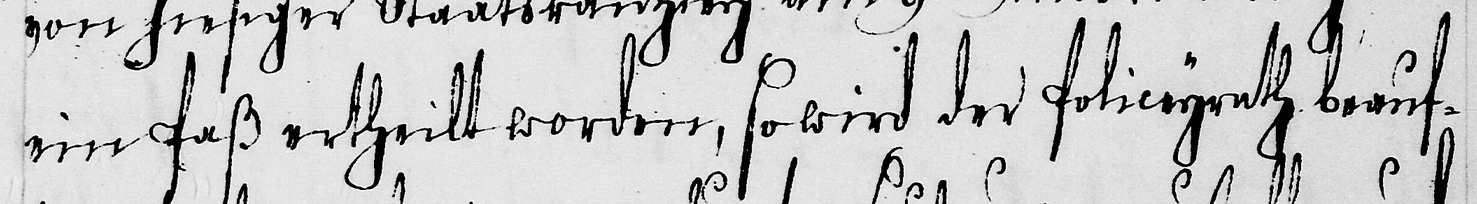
ein Paß ertheilt worden, so wird der Policeyrath beauf¬
